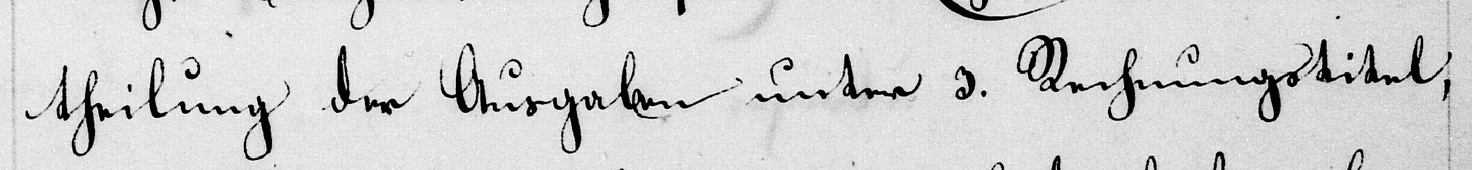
theilung der Ausgaben unter 3. Rechnungstitel,
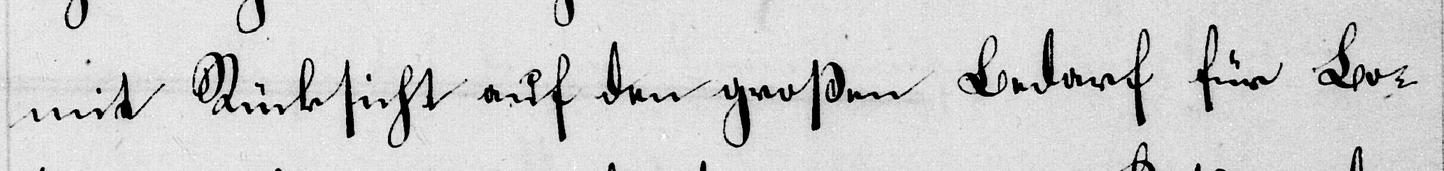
mit Rücksicht auf den großen Bedarf für Bo¬
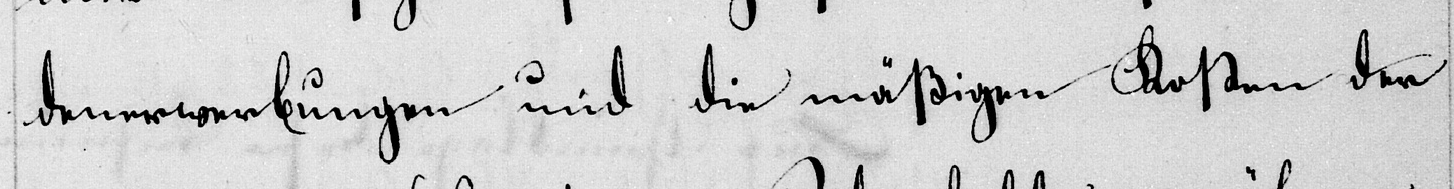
denerwerbungen und die mäßigen Kosten der
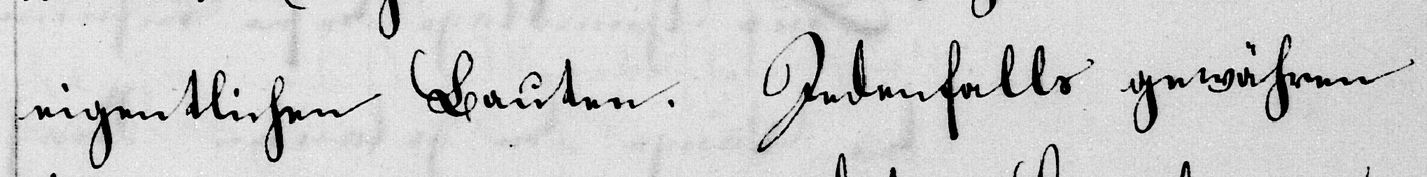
eigentlichen Bauten. Jedenfalls gewähren
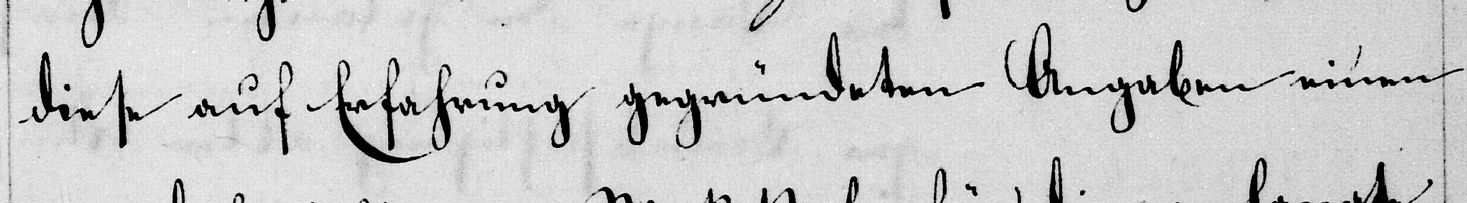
diese auf Erfahrung gegründeten Angaben einen
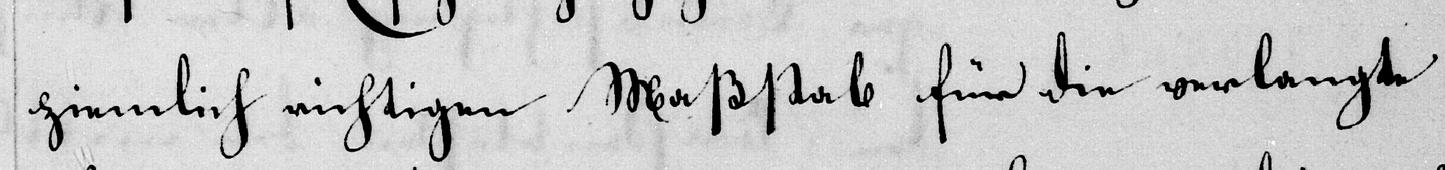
ziemlich richtigen Maßstab für die verlangte
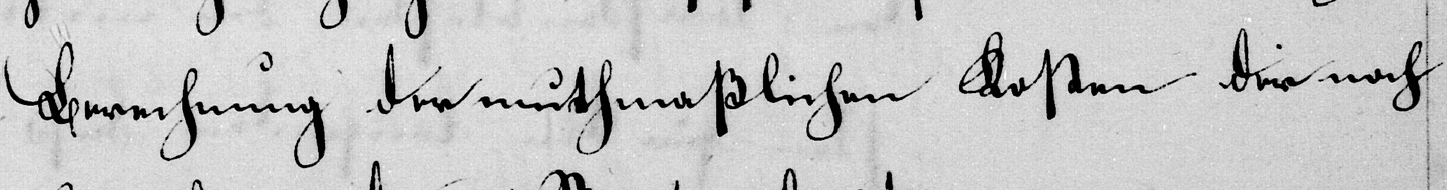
Berechnung der muthmaßlichen Kosten der noch
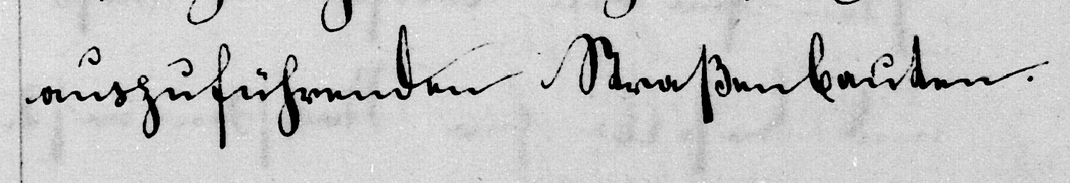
auszuführenden Straßenbauten.
